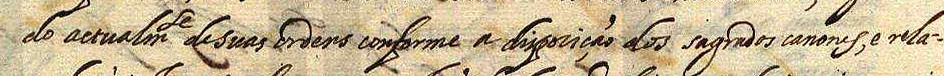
do actualmte de suas ordens conforme a dispozição dos sagrados canones, e rela
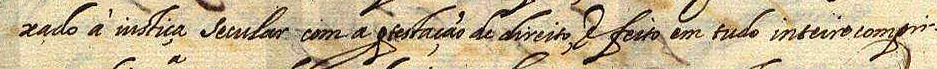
xado a iustiça secular com ꝓtestaçaõ de direito, & feito em tudo inteiro compri
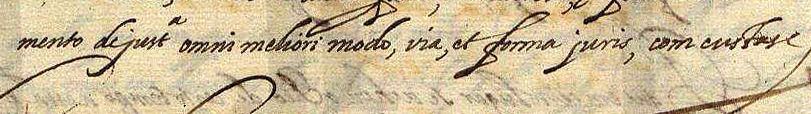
mento de justa omni meliori modo, via, et forma juris, com custas.
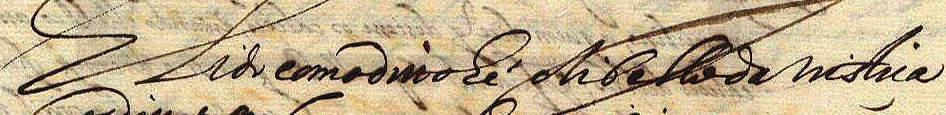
E Lido como ditto hé o libello da iustiça
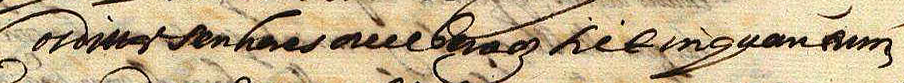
os dittos senhores receberaõ si et in quantum
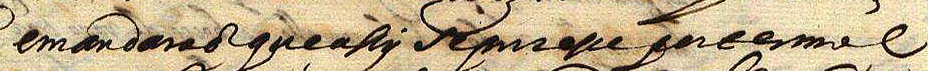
e mandaraõ que assy se puzesse por termo e
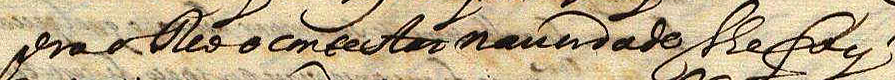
pera o Reo o contestar na uerdade lhe foy
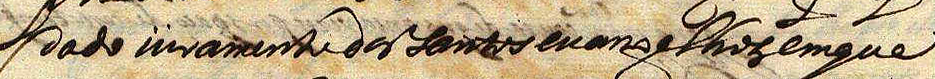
dado iuramento dos santos euangelhos em que
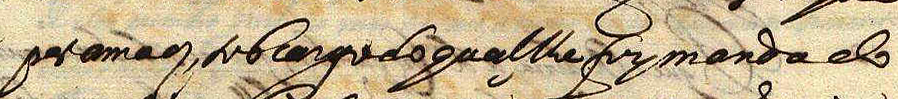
pos a maõ, sob cargo do qual lhe foy mandado
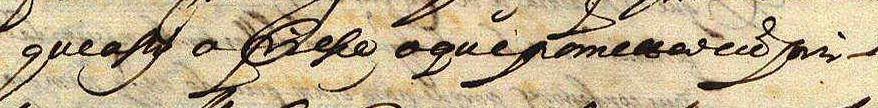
que assy o fizesse o que prometteo cūprir
